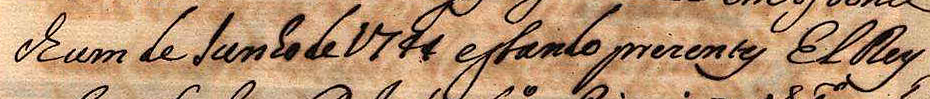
e hum de Iunho de 1744 estando prezentes El Rey
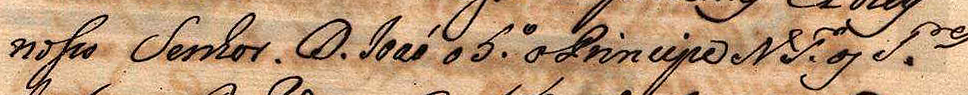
nosso Senhor. D. Ioão 5.o o Principe N. S.r os S.res
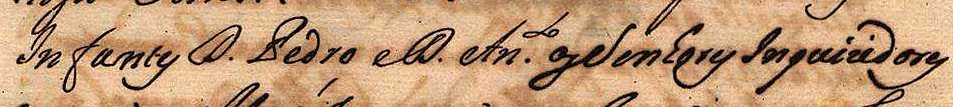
Infantes D. Pedro e D. An.to os Senhores Inquizidores
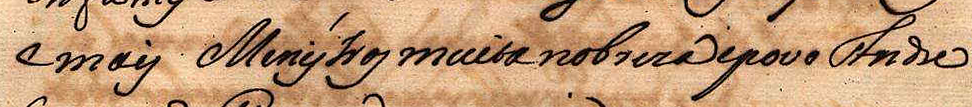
e mais Ministros muita nobreza e povo Andre
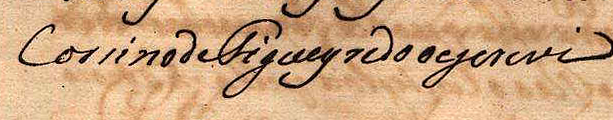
Corsino de Figueyredo o escrevi
